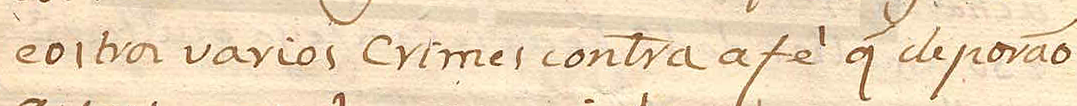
e outros varios crimes contra a fé q̄ deporão
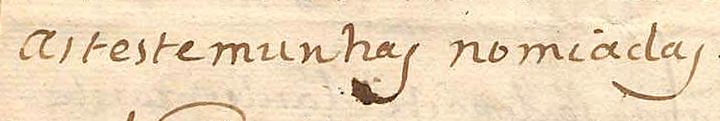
as testemunhas nomiadas.
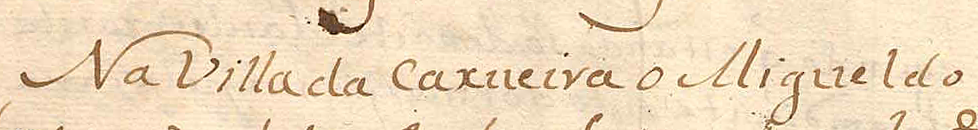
Na Villa da Caxueira o Miguel do
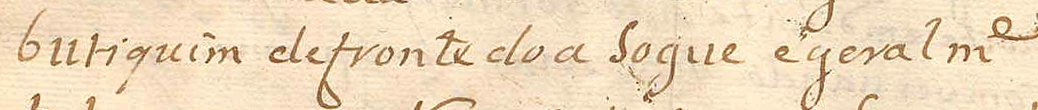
butiquim defronte do asogue e geralm.e
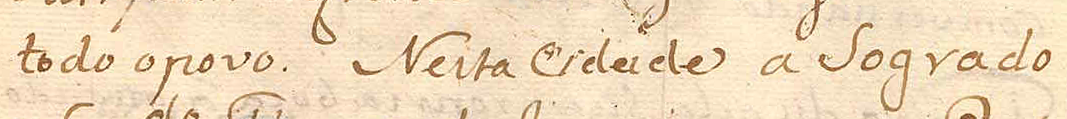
todo o povo. Nesta Cidade a Sogrado
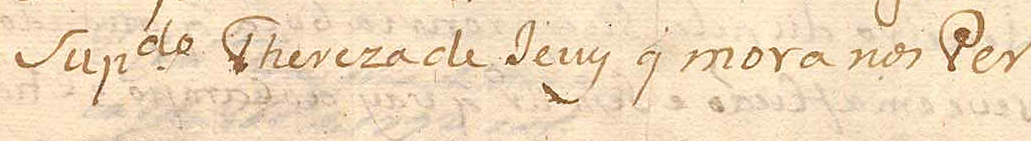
Sup.do Thereza de Iesus q̄ mora nos Per
